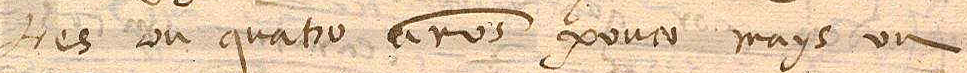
tres ou quatro a̅nos pouco mays ou
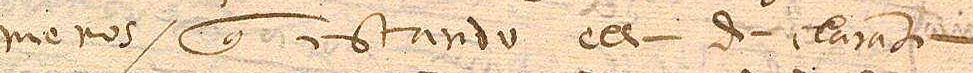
menos / q̅ estando elle declara̅te
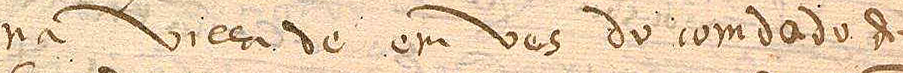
na villa de em ves do comdado de
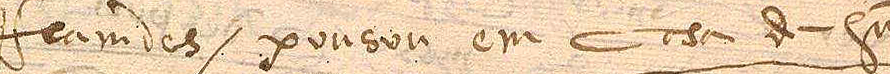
flamdes / pousou em Casa de hu̅
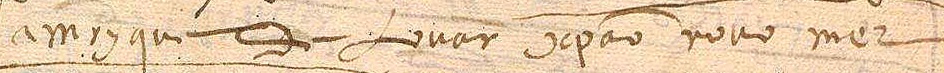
amryque de touar xpão nouo mer
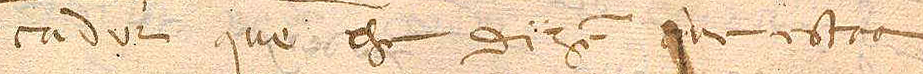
cador que lhe dize̅ que estaa
